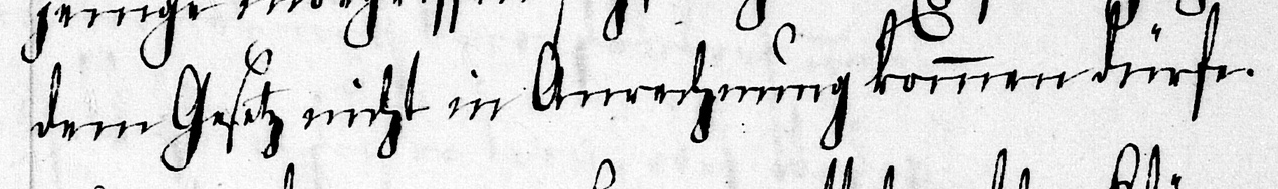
dem Gesetz nicht in Anrechnung kommen dürfe.
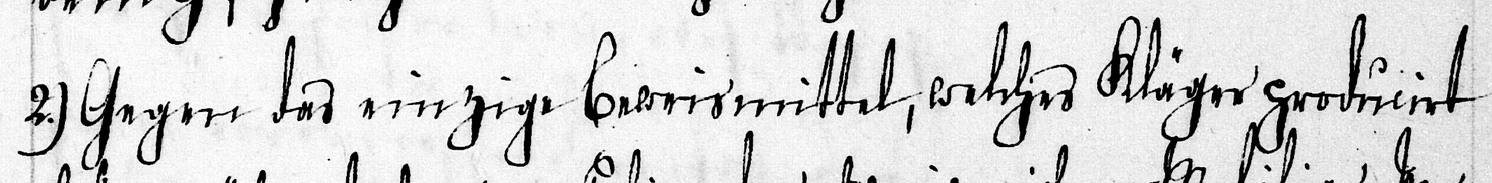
2.) Gegen das einzige Beweismittel, welches Kläger producirt
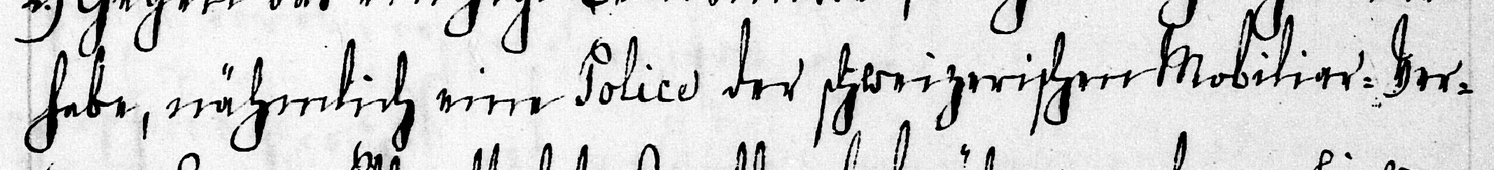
habe, nähmlich eine Police der schweizerischen Mobiliar-Ver¬
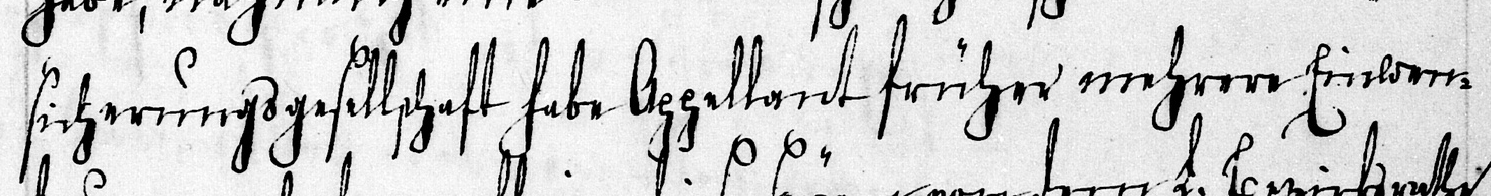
sicherungsgesellschaft habe Appellant früher mehrere Einwen¬
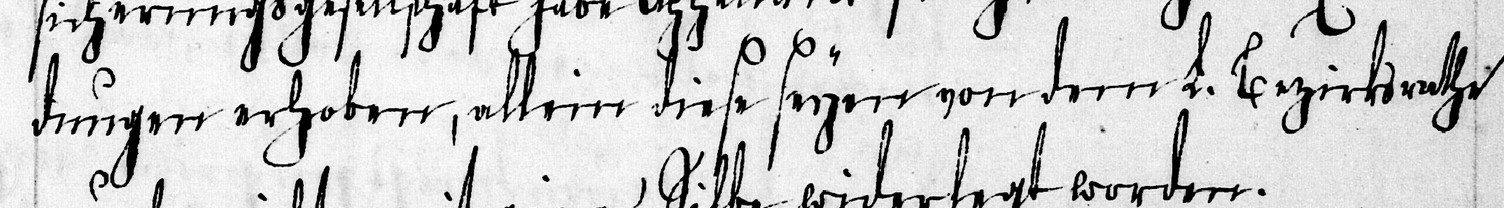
dungen erhoben, allein diese seyen von dem L. Bezirksrathe
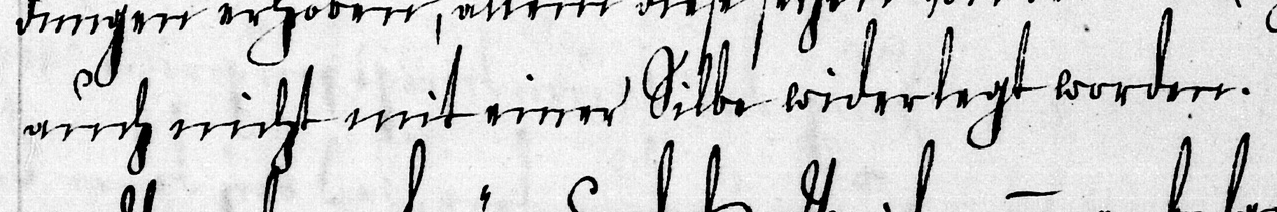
auch nicht mit einer Silbe widerlegt worden.
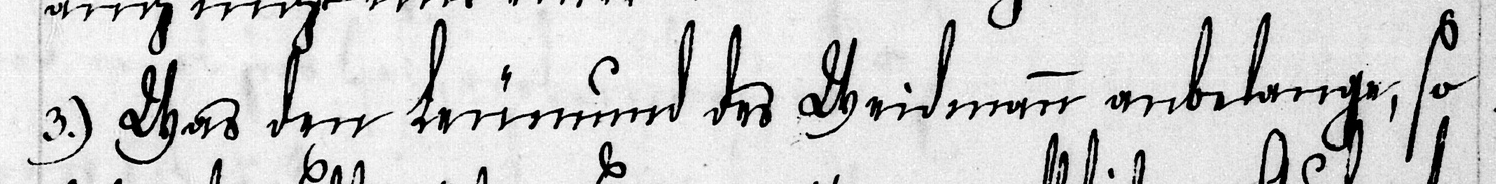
3.) Was den Leumund des Weidmann anbelange, so
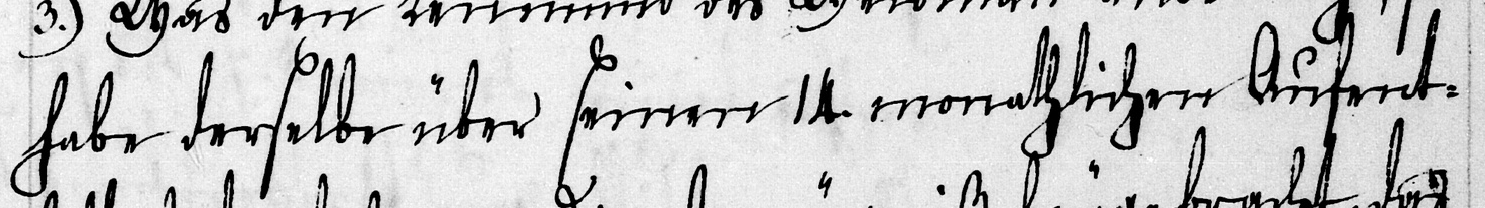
habe derselbe über seinen 14. monathlichen Aufent¬
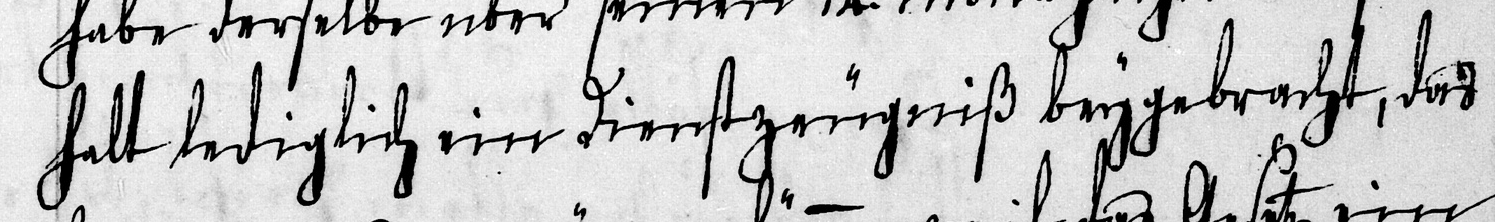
halt lediglich ein Dienstzeugniß beygebracht, das
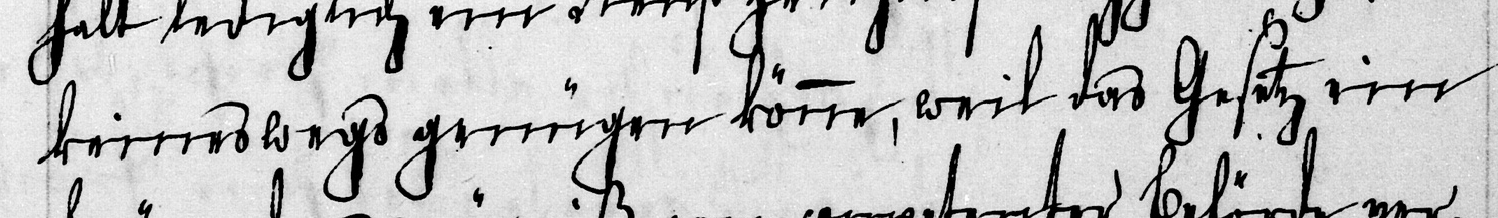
keineswegs genügen könne, weil das Gesetz ein
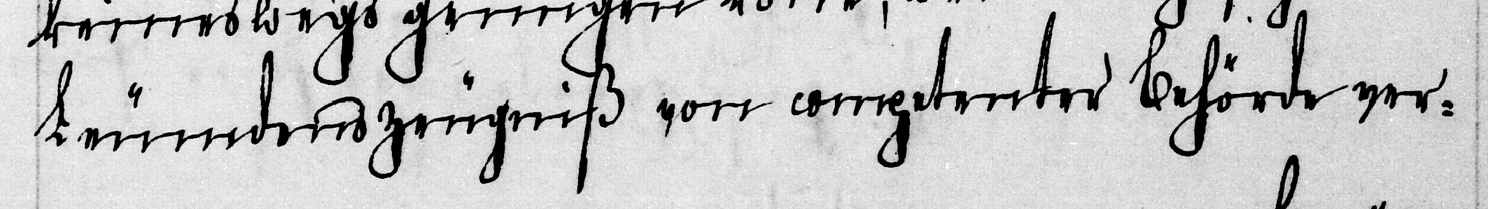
Leumdenszeugniß von competenter Behörde ver-
